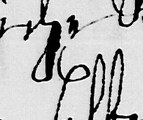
terlaß¬
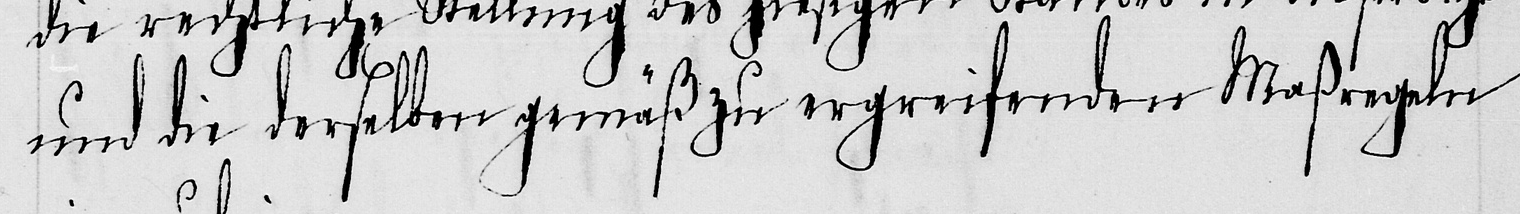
und die derselben gemäß zu ergreifenden Maßregeln
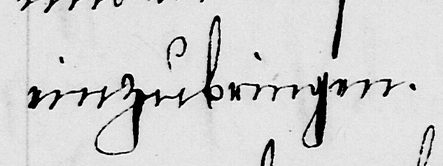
einzubringen.
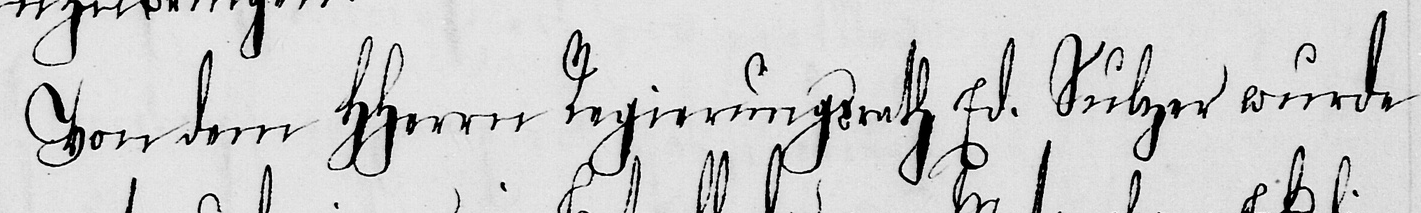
Von dem HHerrn Regierungsrath Ed. Sulzer wurde
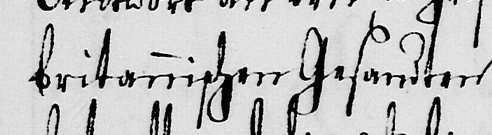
britannischen Gesandten
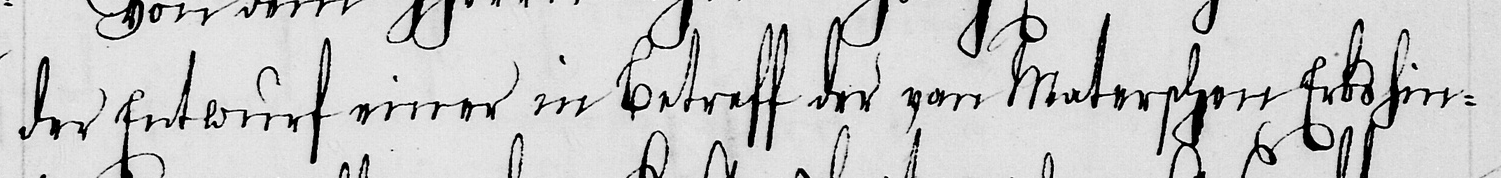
der Entwurf einer in Betreff der van Materschen Erbshin¬
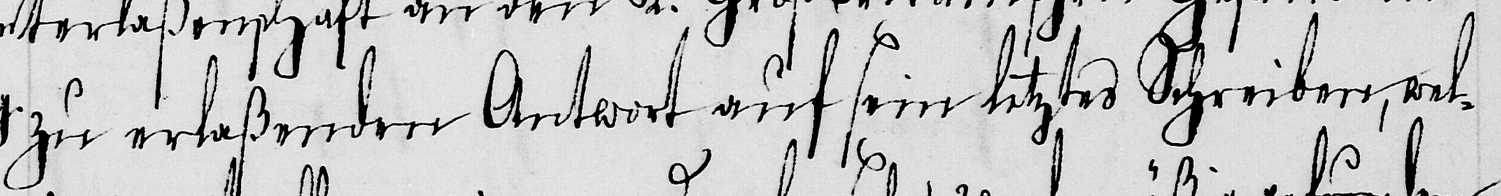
zu erlaßenden Antwort auf sein letztes Schreiben, wel¬
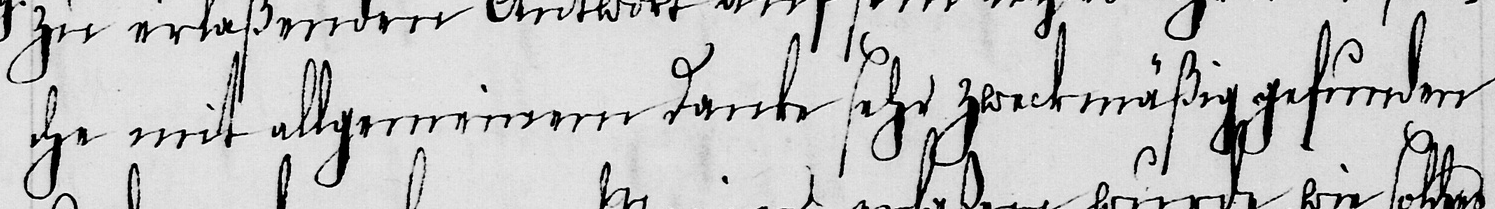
che mit allgemeinem Danke sehr zweckmäßig gefunden
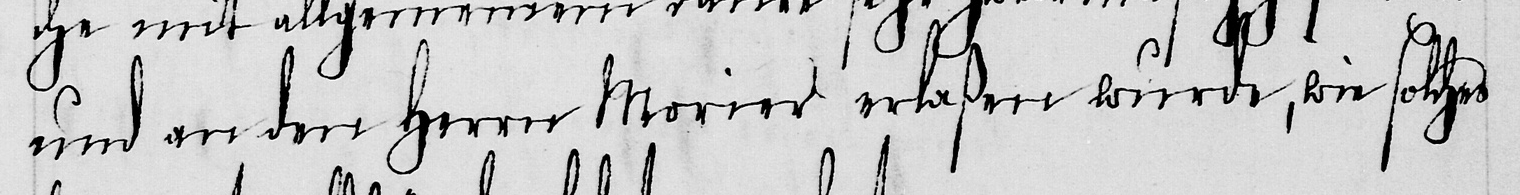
und an den Herrn Morier erlaßen wurde, wie solches
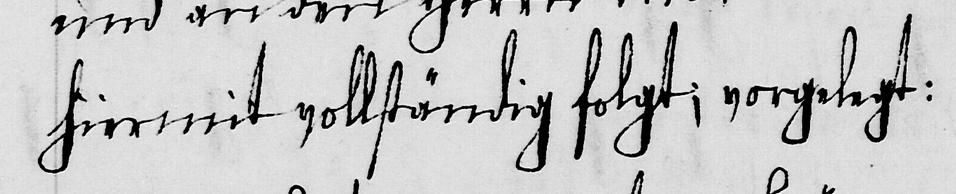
hiermit vollständig folgt; vorgelegt:
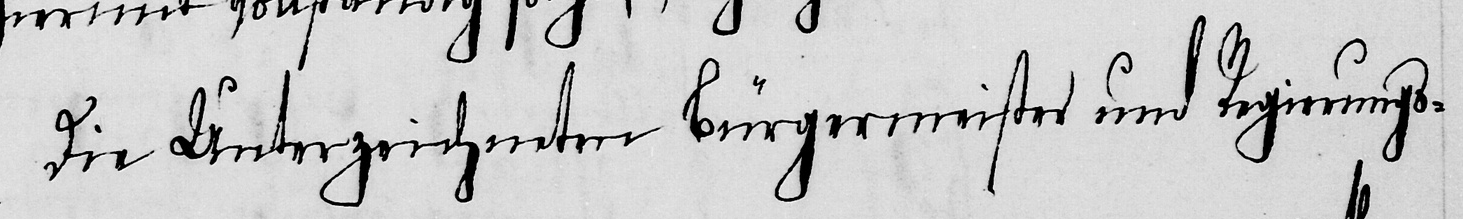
Die Unterzeichneten Bürgermeister und Regierungs-
